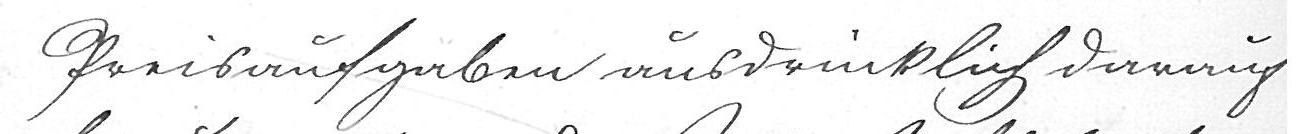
Preisaufgaben ausdrücklich darauf
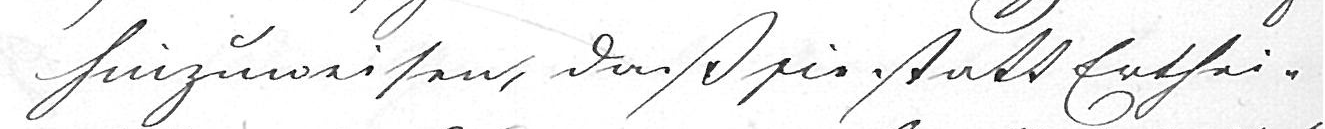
hinzuweisen, daß sie statt Erthei-
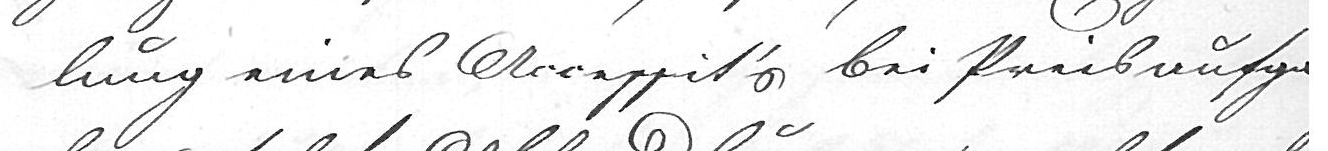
lung eines Accessit's bei Preisaufga-
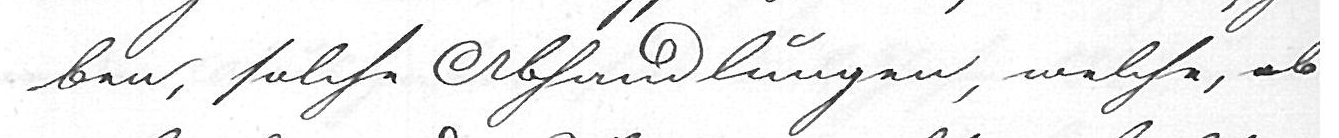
ben, solche Abhandlungen, welche ob-
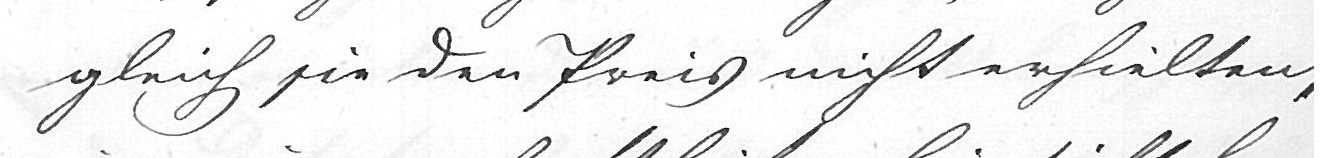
gleich sie den Preis nicht erhielten,
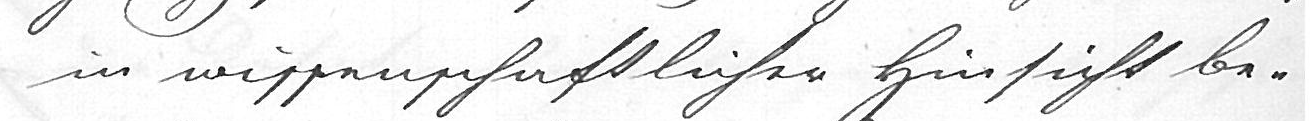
in wissenschaftlicher Hinsicht be-
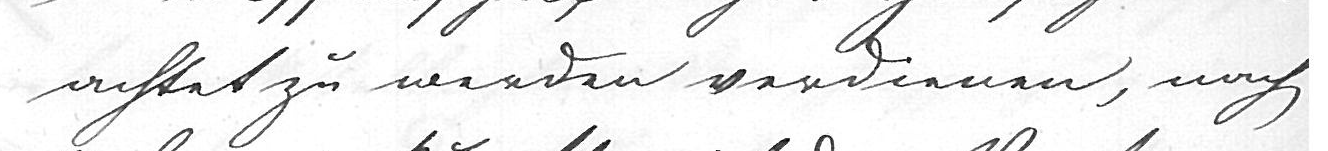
achtet zu werden verdienen, nach
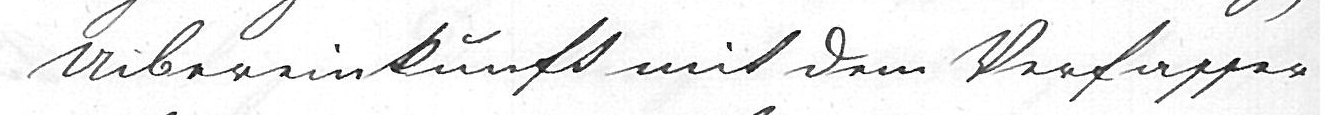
Uibereinkunft mit dem Verfasser
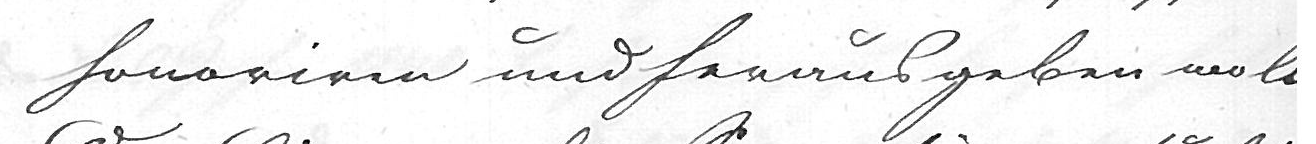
honoriren und herausgeben wolle.
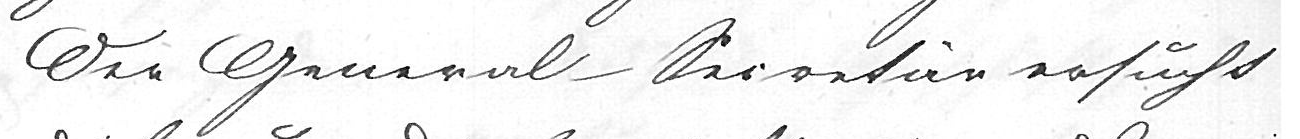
Der General-Secretär ersucht
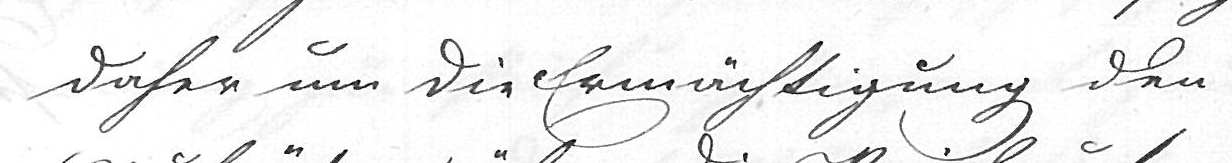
daher um die Ermächtigung den
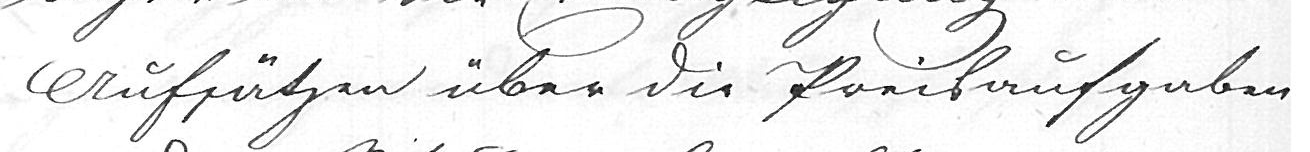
Aufsätzen über die Preisaufgaben
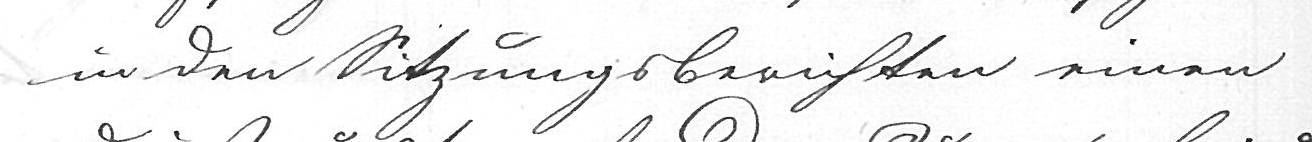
in den Sitzungsberichten einen
